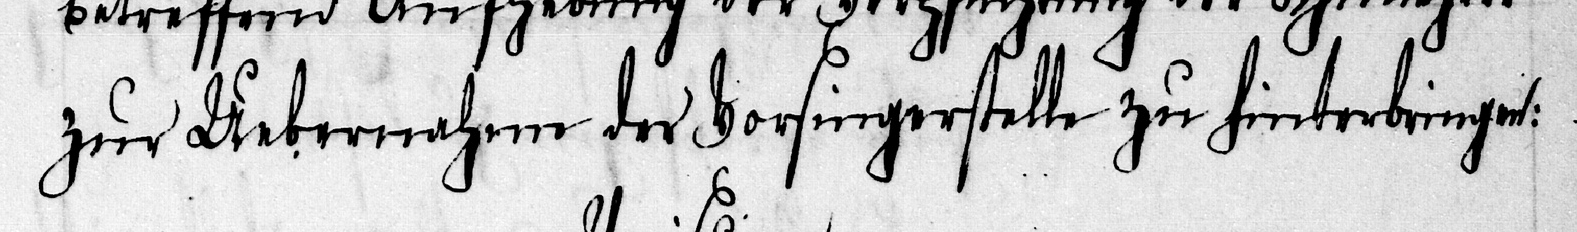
zur Uebernahme der Vorsingerstelle zu hinterbringen.
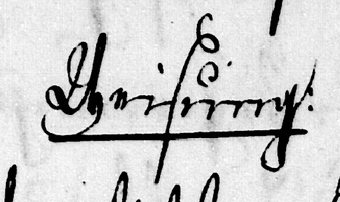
Weisung:
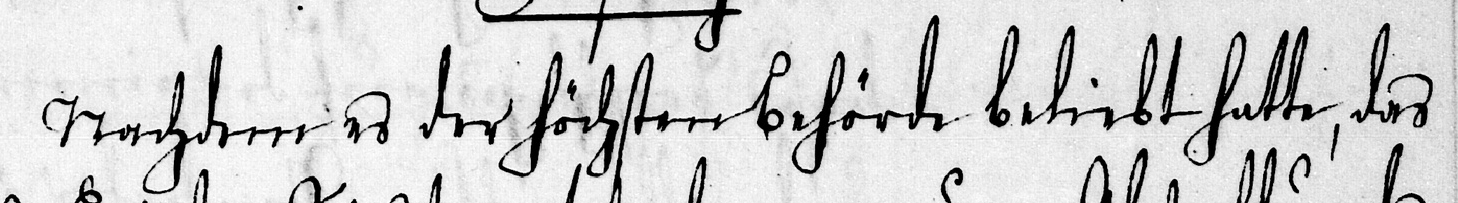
Nachdem es der höchsten Behörde beliebt hatte, das
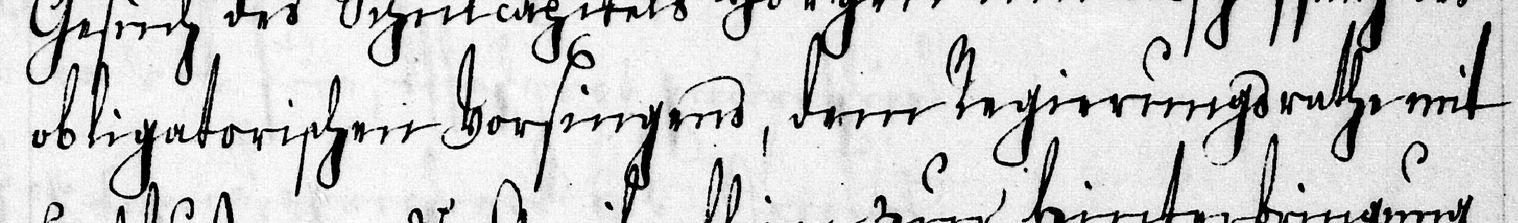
obligatorischen Vorsingens, dem Regierungsrathe mit
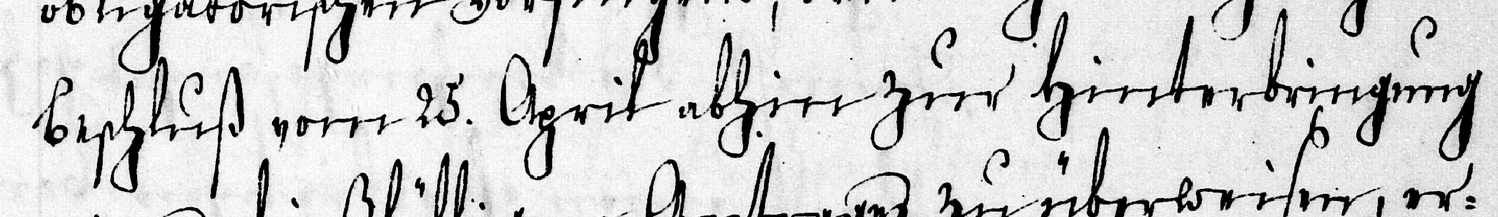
Beschluß vom 25. April abhin zur Hinterbringung
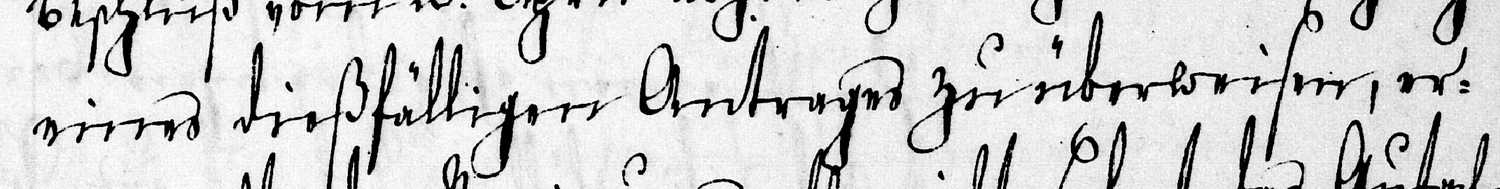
eines dießfälligen Antrages zu überweisen, er¬
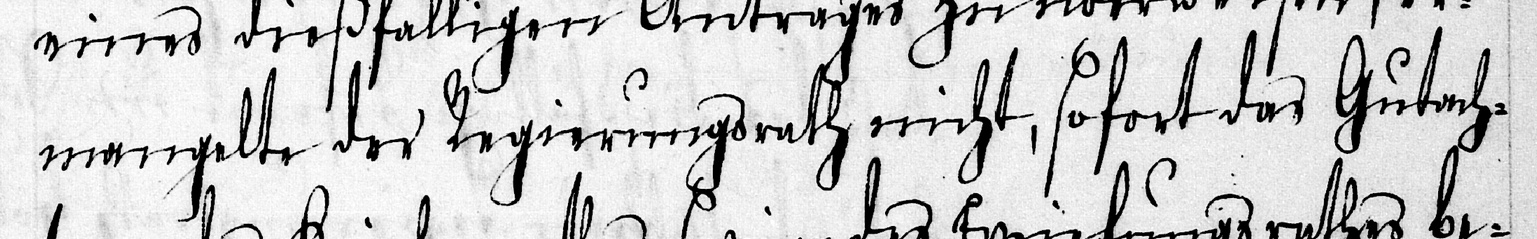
mangelte der Regierungsrath nicht, sofort das Gutach¬
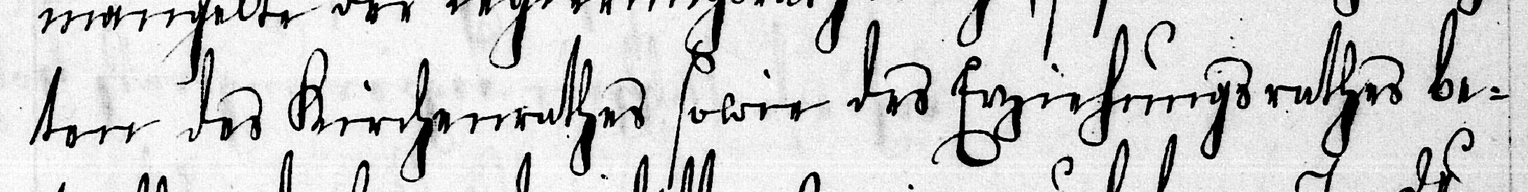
ten des Kirchenrathes sowie des Erziehungsrathes be¬
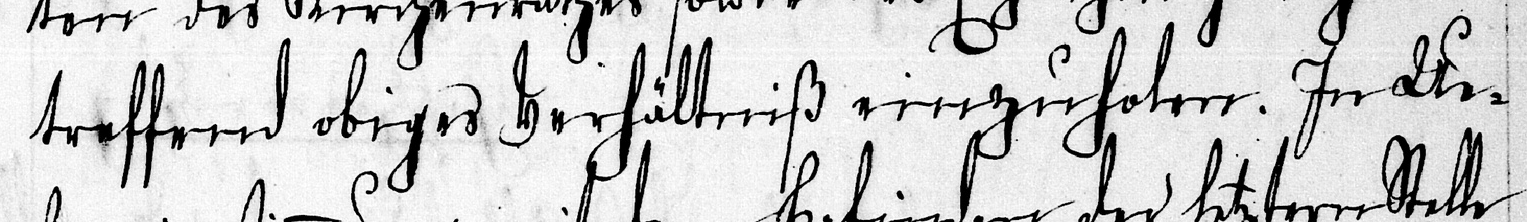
treffend obiges Verhältniß einzuholen. In Ue¬
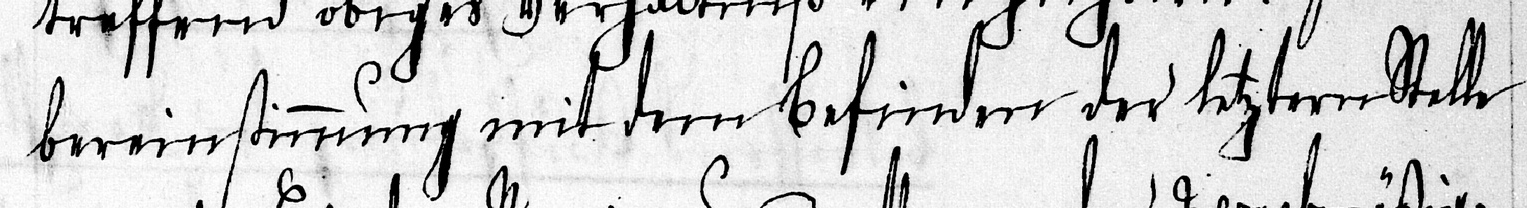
bereinstimmung mit dem Befinden der letztern Stelle
